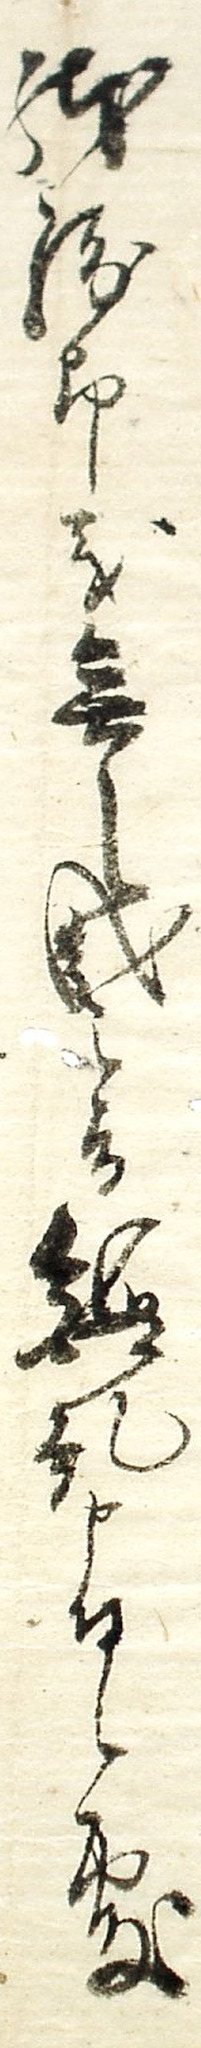躰紛布義無之哉之旨鍛糺申付候處
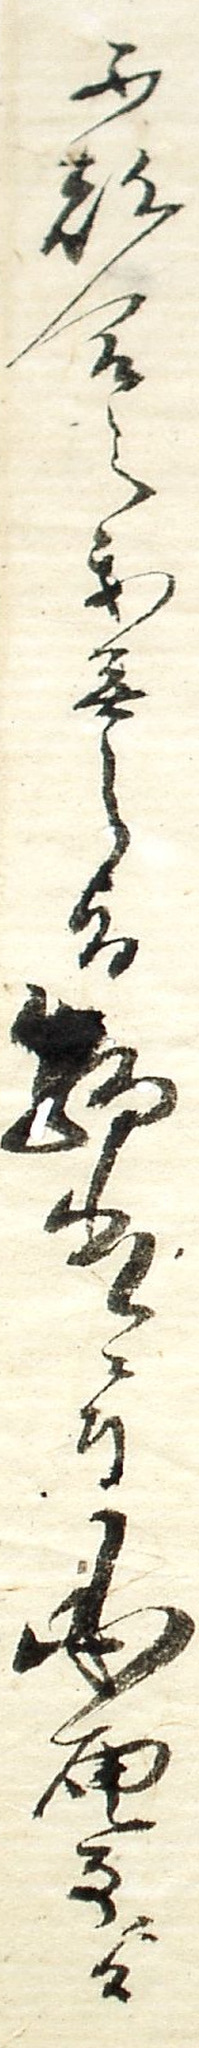不都合之義無之旨勘書候ニ付承届候事ニ候
